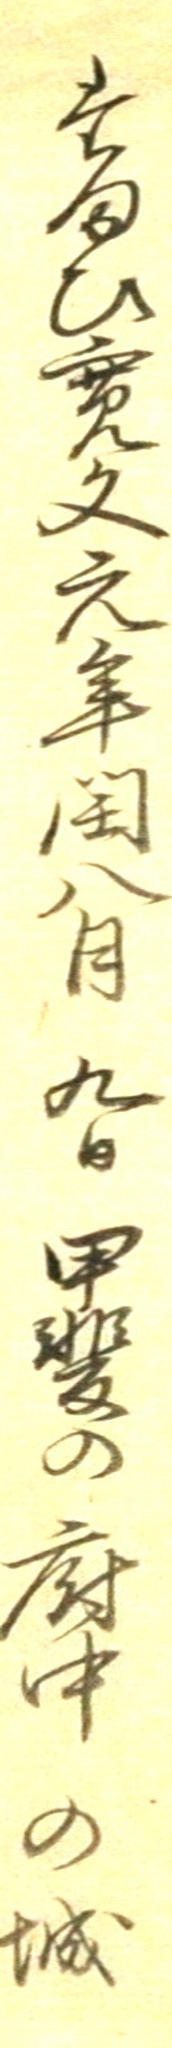たまひ寛文元年閏八月九日甲斐の府中の城
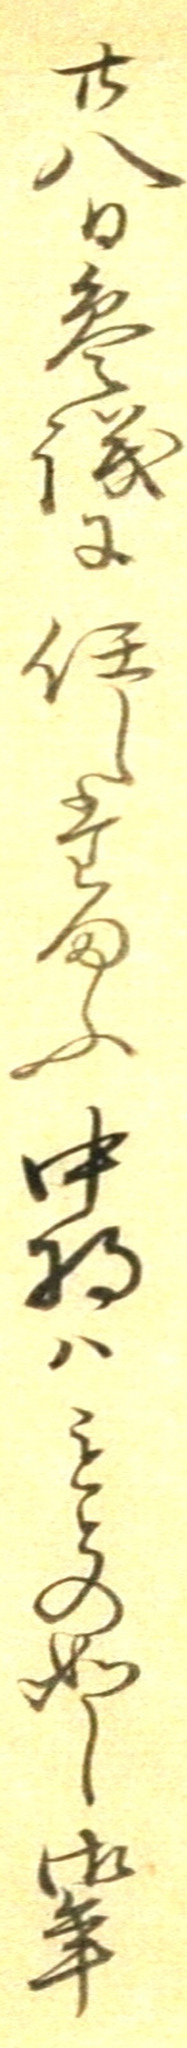廿八日参議に任したまふ中将はもとの如し御年
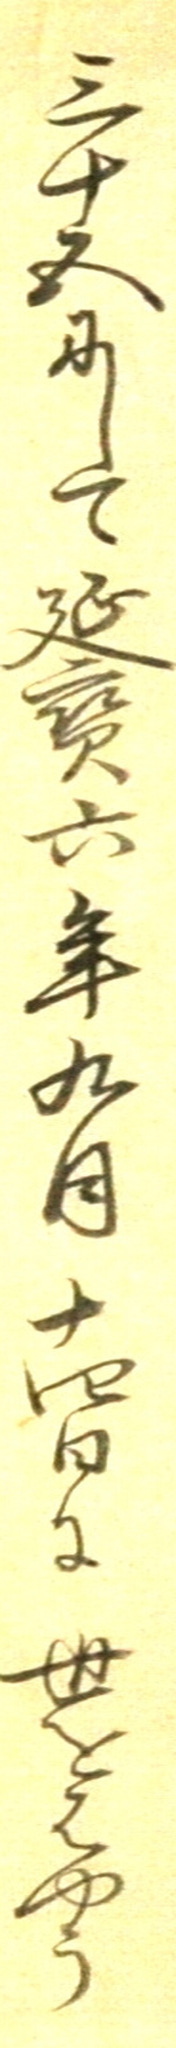三十五にして延宝六年九月十四日に世をはやう
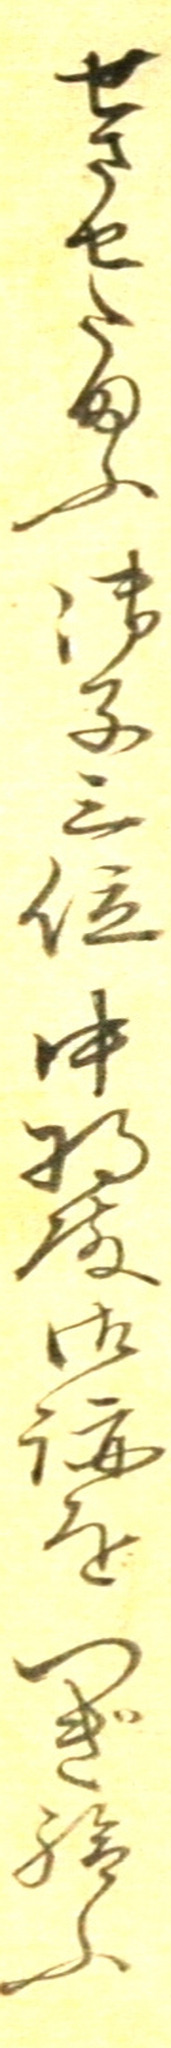せさせたまふ御子三位中将殿御跡をつぎ給ふ

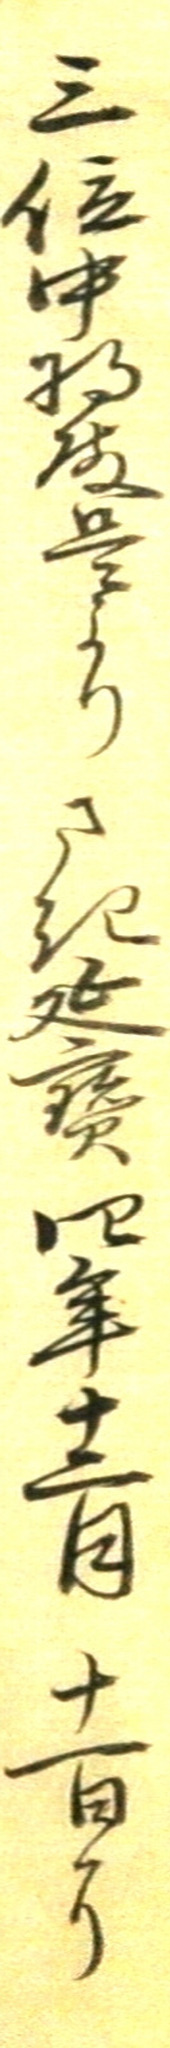三位中将殿是よりさき延宝四年十二月十一日に
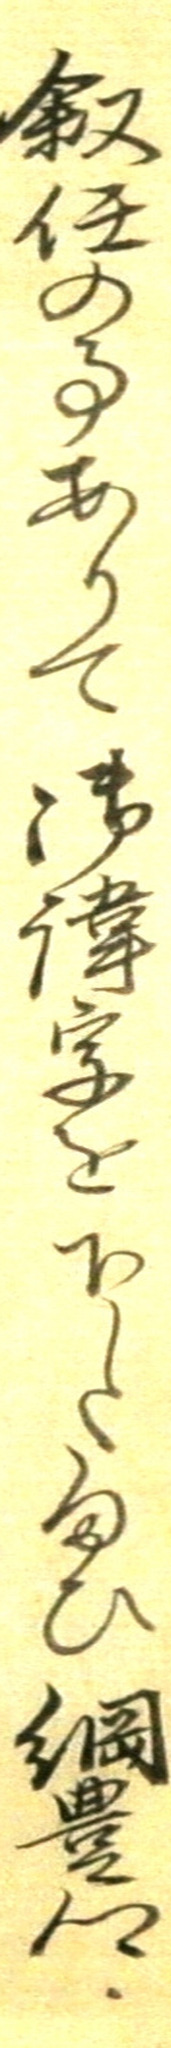叙任の事ありて御諱字を下したまひ綱豊卿
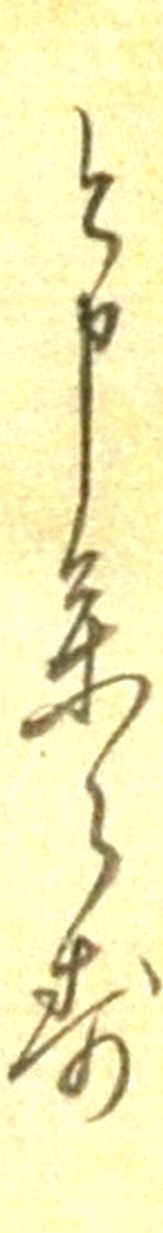と申参らす
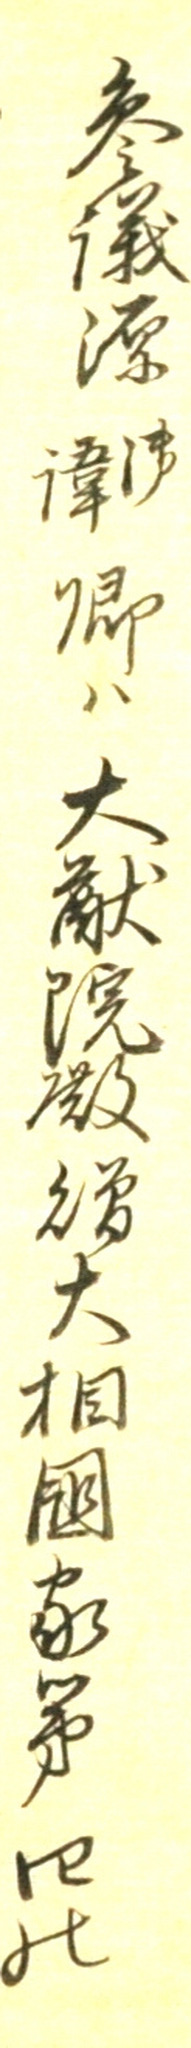参議源御諱卿は大猷院殿贈大相国家第四の
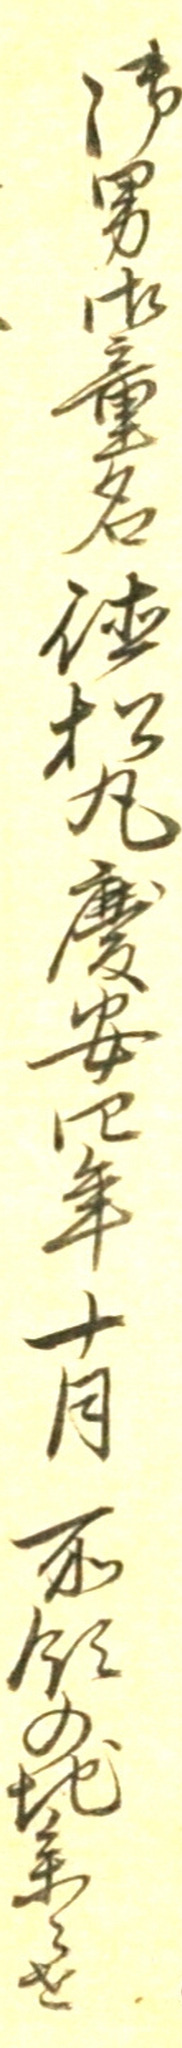御男御童名徳松丸慶安四年十月所領の地参らせ
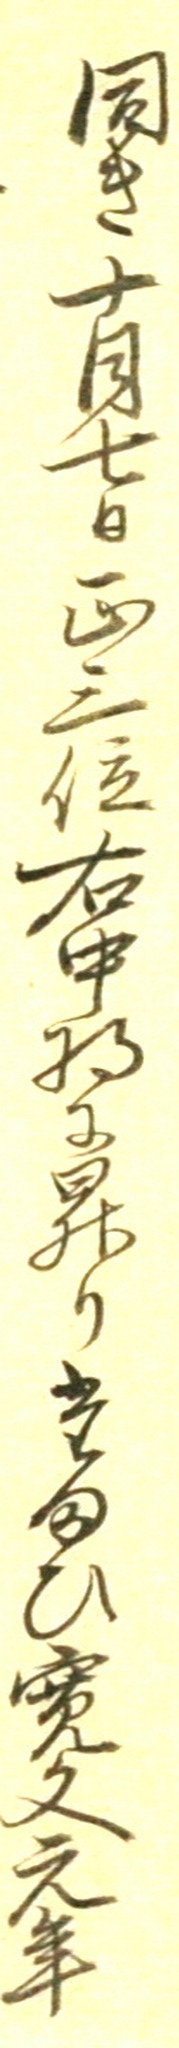同き十月七日正三位右中将に昇りたまひ寛文元年
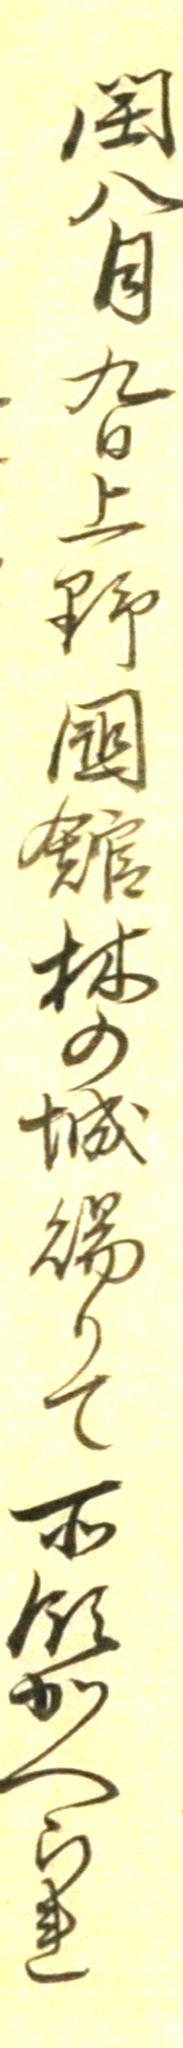閏八月九日上野国館林の城賜りて所領加へられ
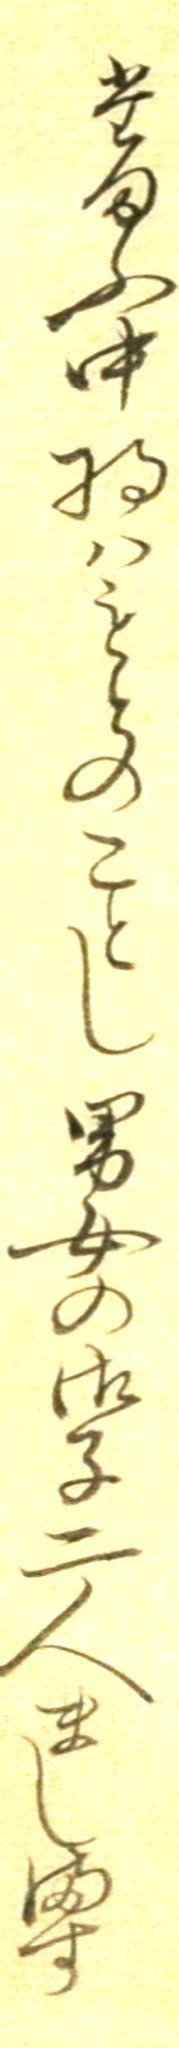たまふ中将はもとのことし男女の御子二人まします
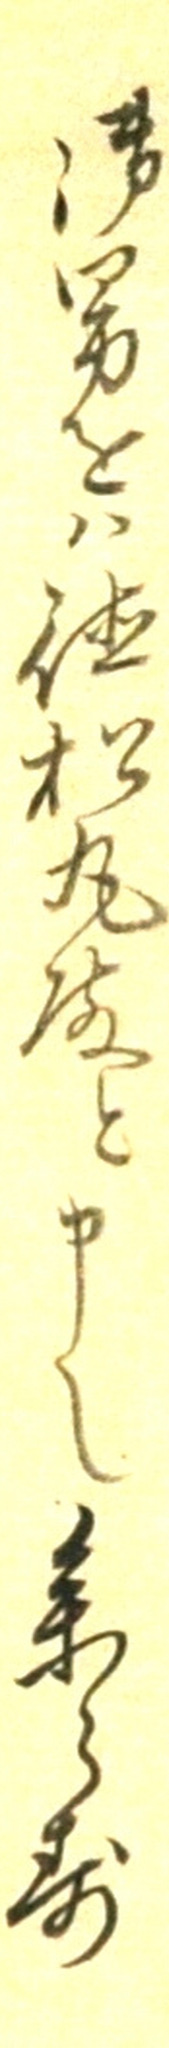御男をは徳松丸殿と申し参らす
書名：藩翰譜（一）
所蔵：伊那市立高遠町図書館・合同会社AMANE
